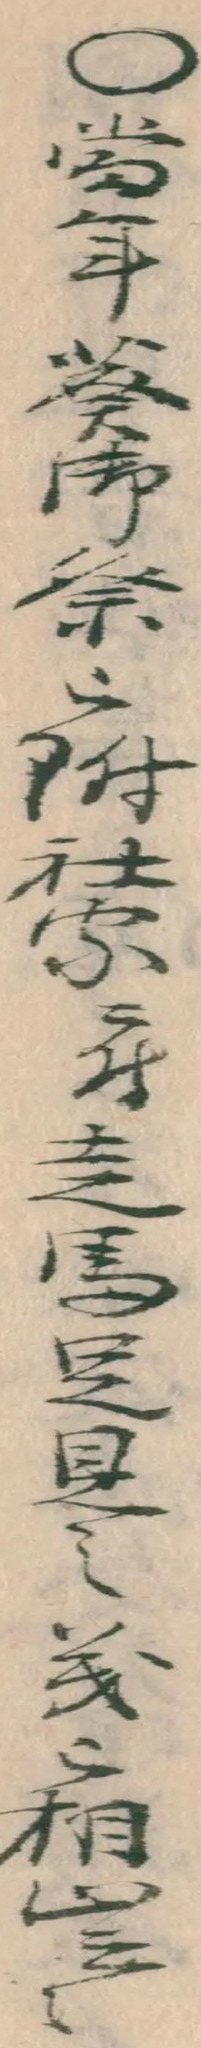〇当年葵御祭被附社家ニ付走馬足見之義被相止云々
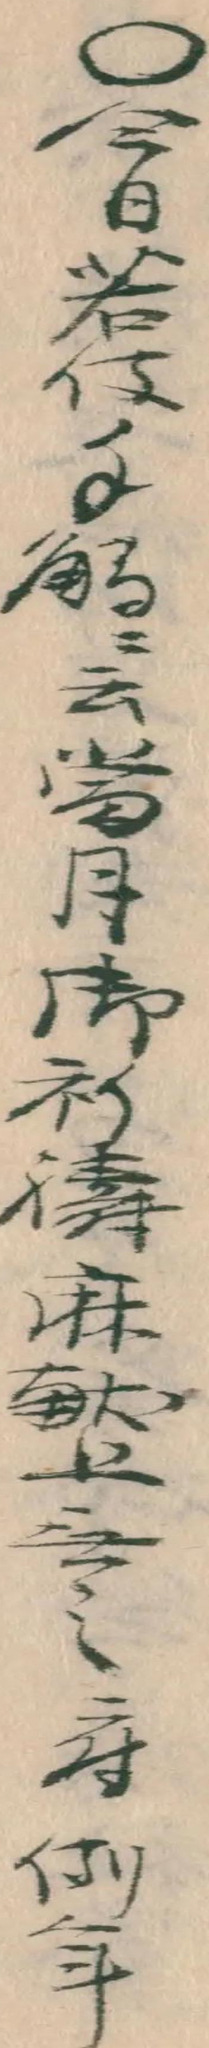○今日若役手触ニ云当月御祈祷麻献上無之ニ付例年
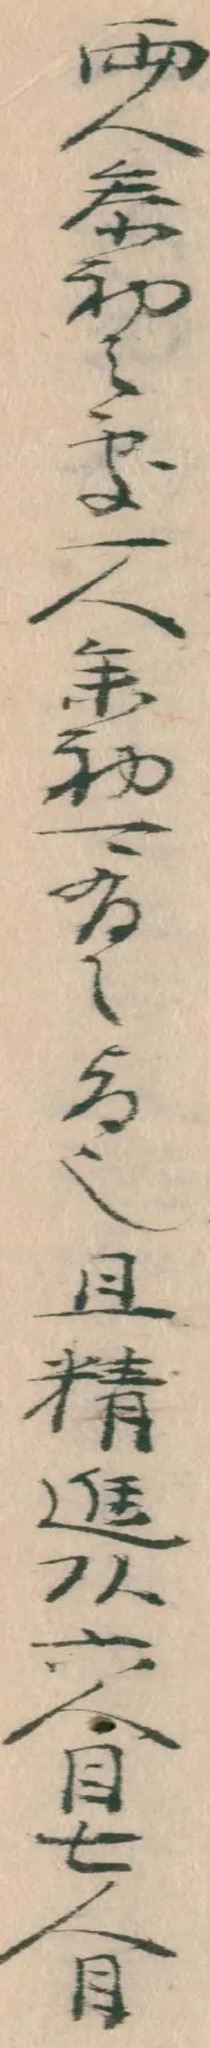両人参勤之処一人参勤可有之旨也且精進頭六人目七人目
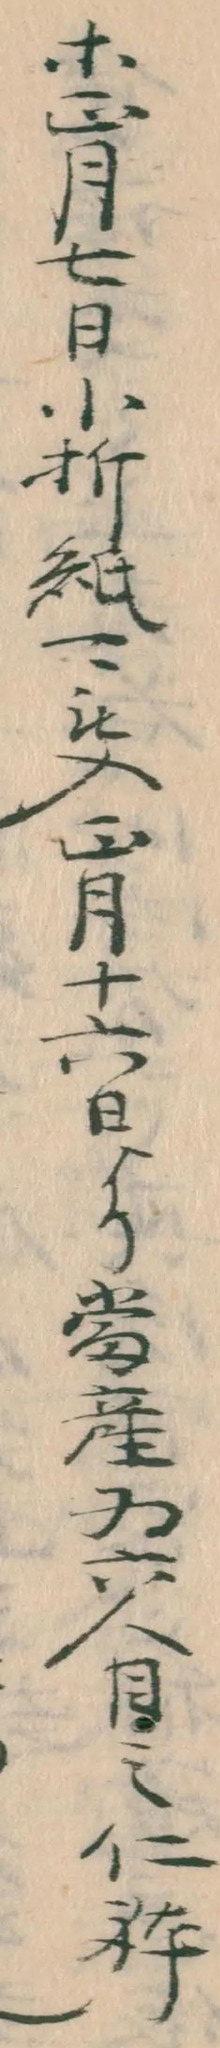未正月七日小折紙可被入正月十六日より当座為六人目之仁躰
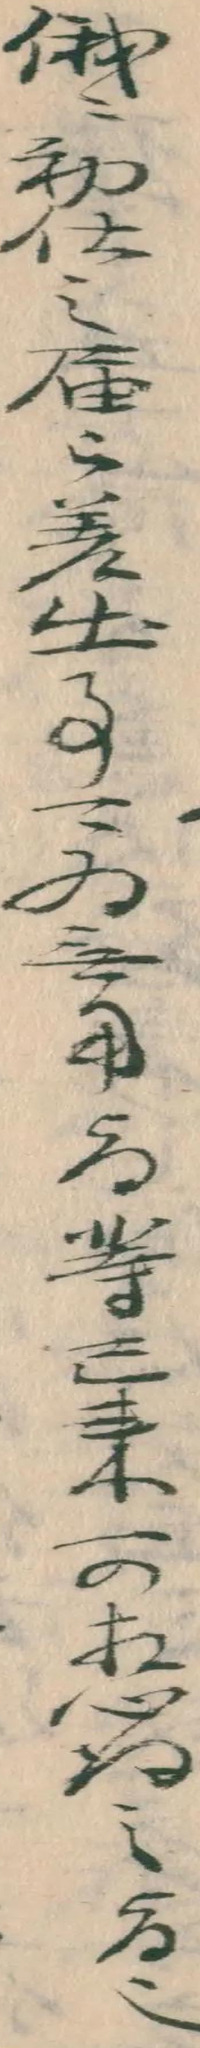俄ニ勤仕之届被差出事可為無用旨等已来可相心得之旨也
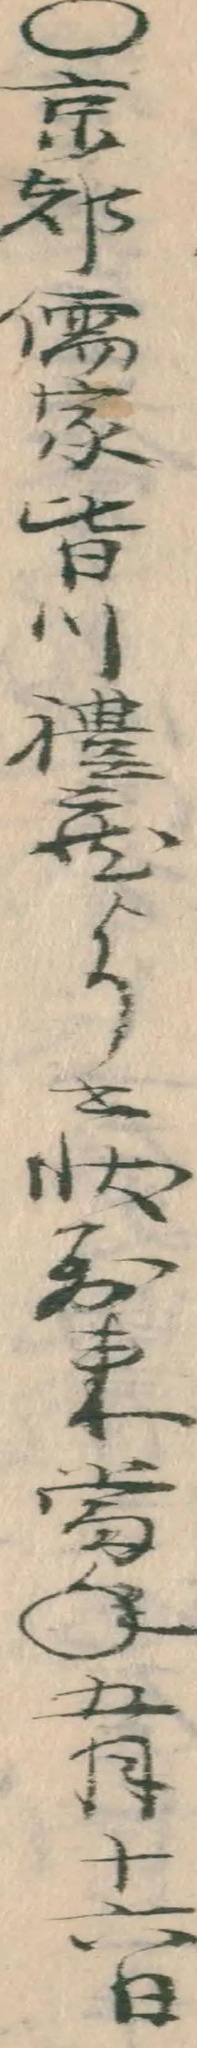○京都儒家皆川礼蔵より書状到来当年五月十六日
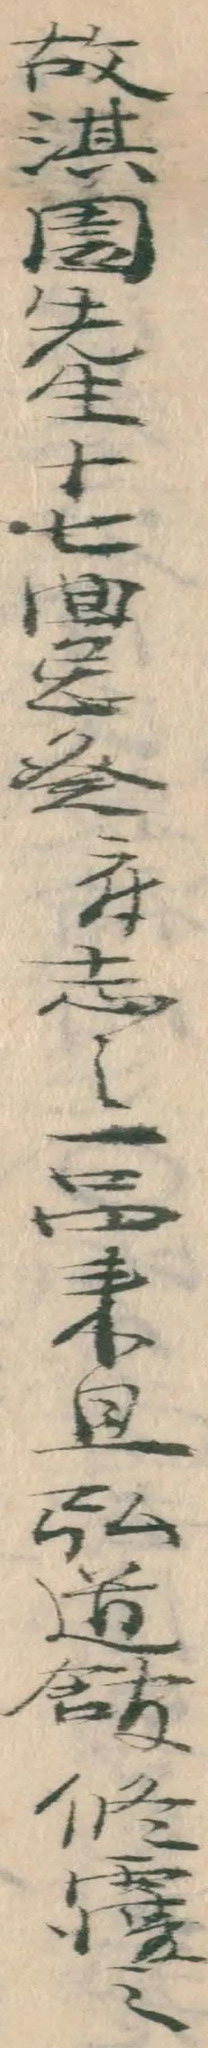故淇園先生十七回忌祭ニ付志之一品来且弘道館修覆之
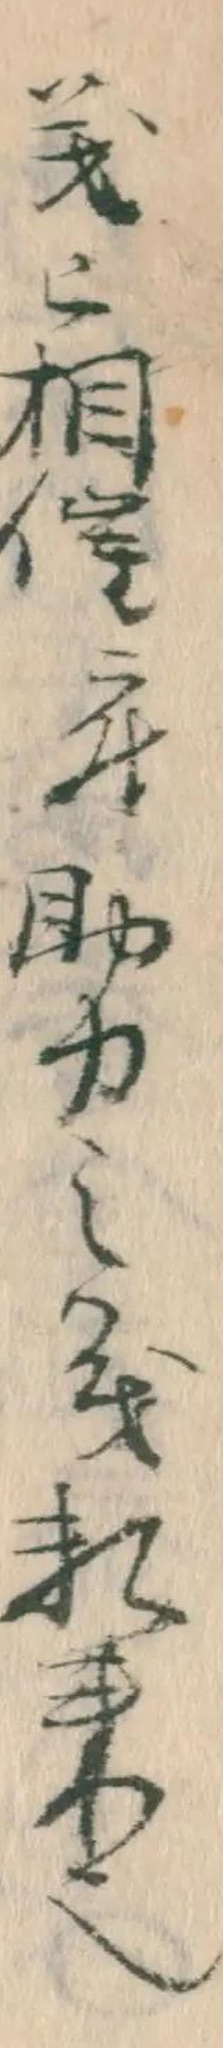義被相催ニ付助力之義頼来也
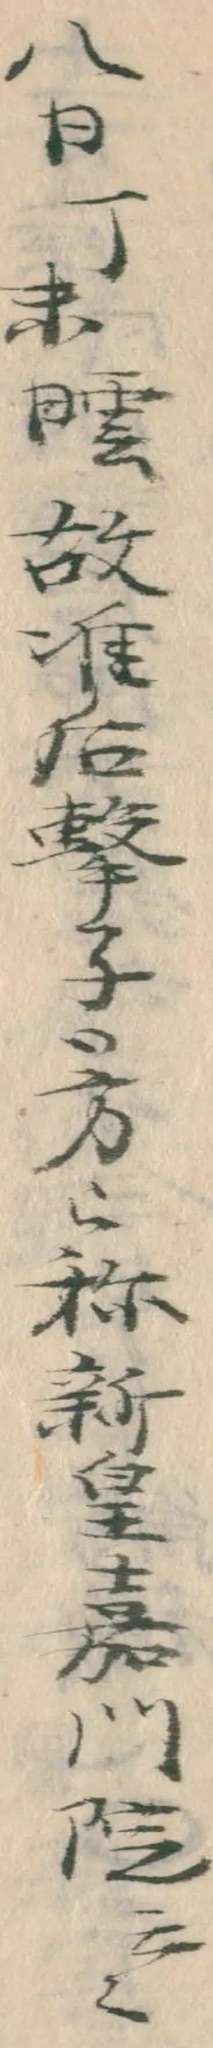八日丁未曇故准后撃子御方被称新皇嘉門院云〻
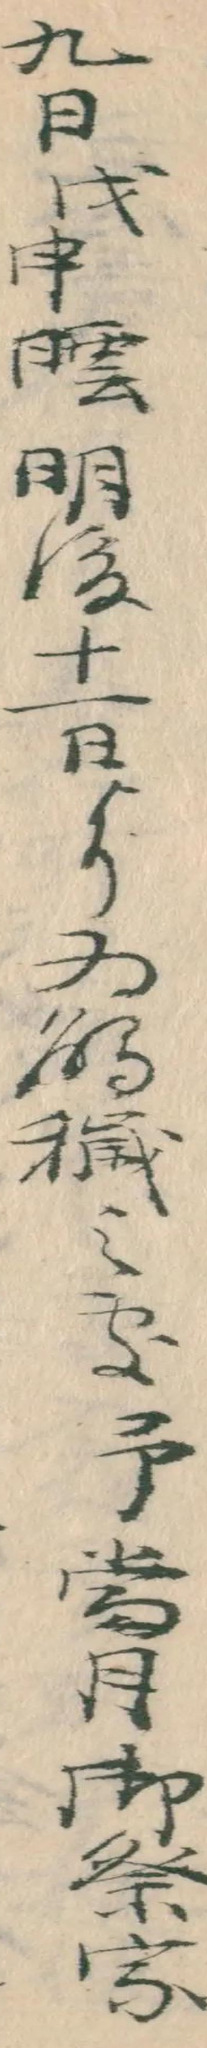九日戊申曇明後十一日より為触穢之処予当月御祭家
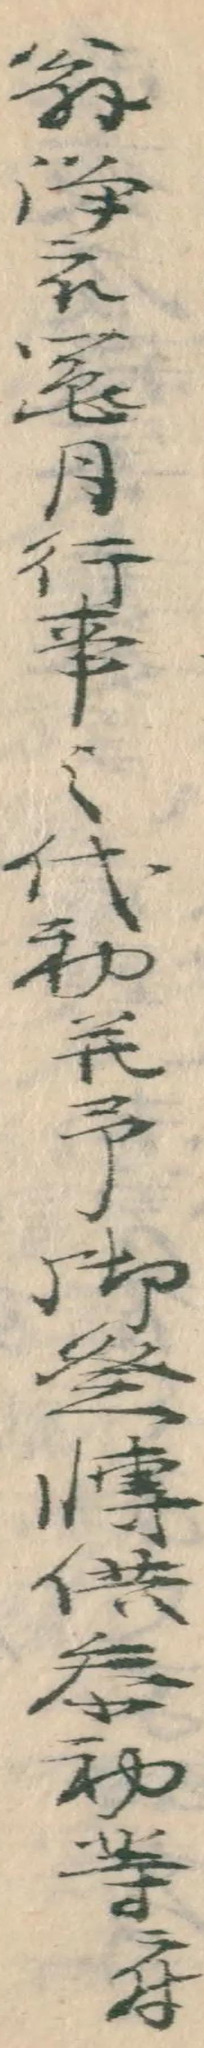翁浄衣鬮月行事之代勤并予御祭転供参勤等に付
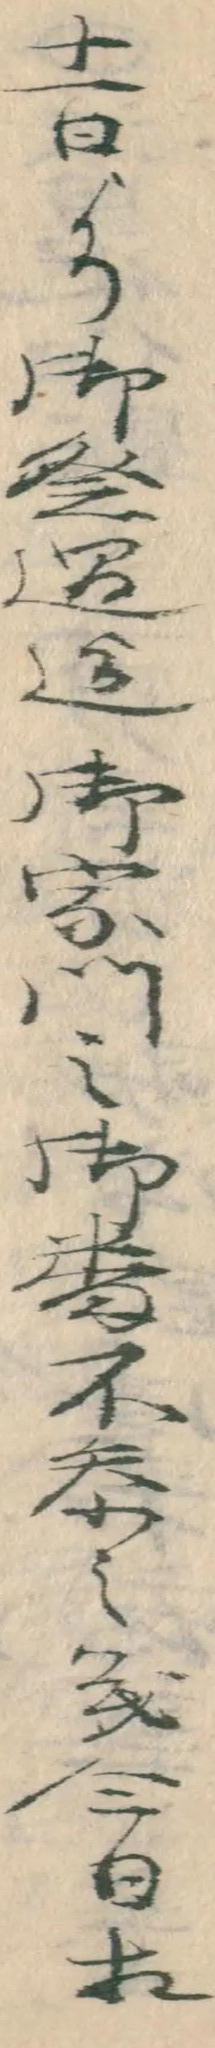十一日より御祭過迄御家門之御番不参之義今日相
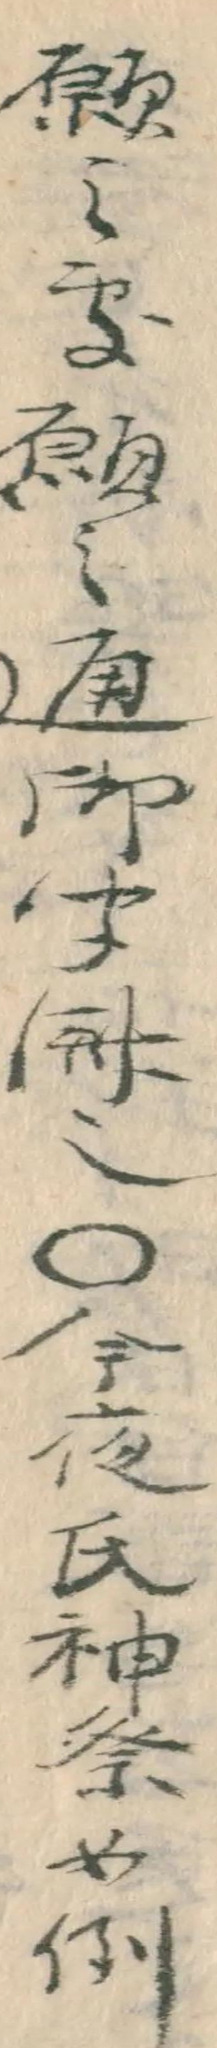願之処願之通御聞済也○今夜氏神祭如例
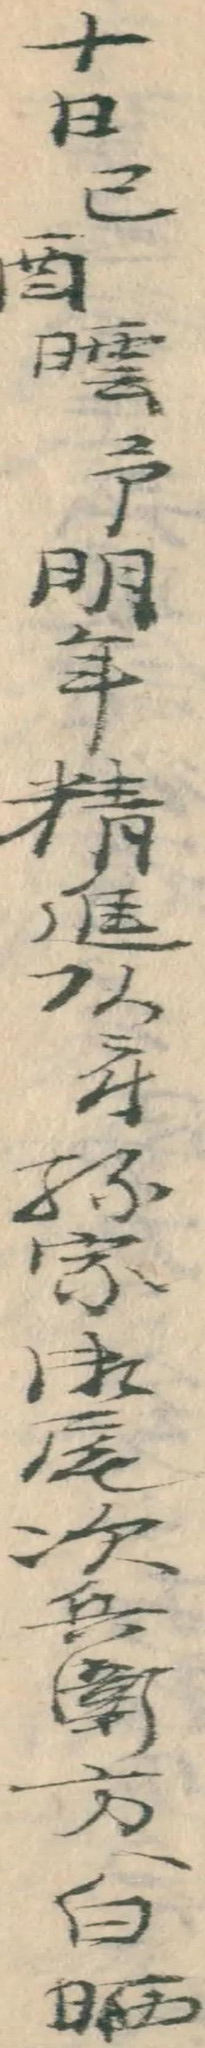十日己酉曇予明年精進頭ニ付縁家瀬尾次兵衛方へ白晒
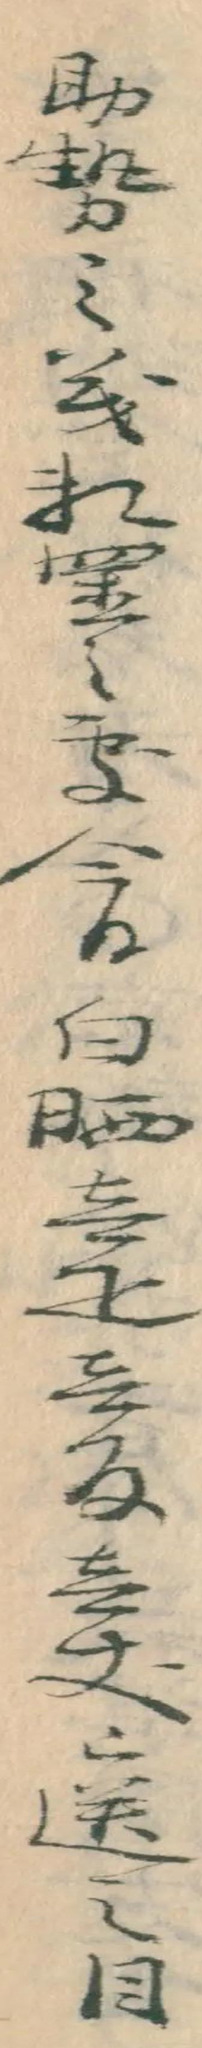助勢之義頼置之処今日白晒壱疋壱反壱丈被送之目

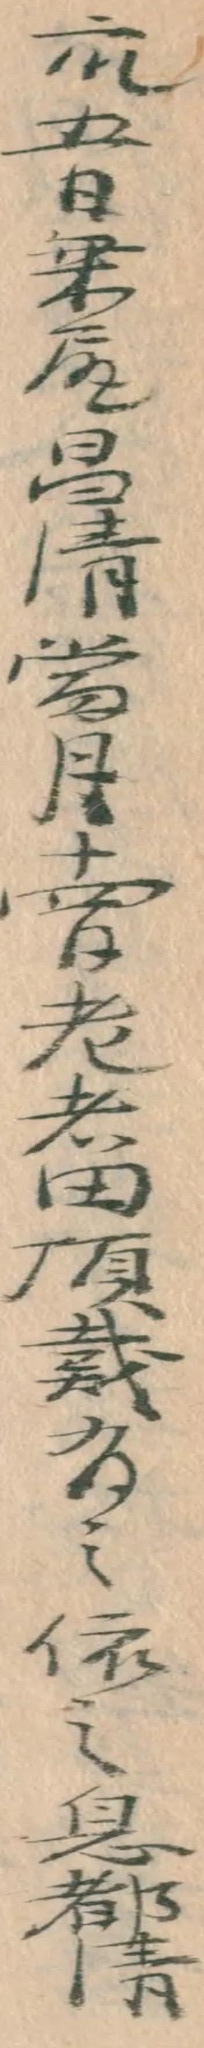衆五日乗尻昌清当月十四日老者田頂戴有之依之息都清
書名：賀茂社記録. 第64冊
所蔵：国立国会図書館 National Diet Library, JAPAN
